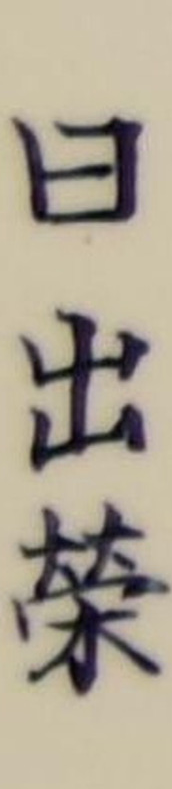日出榮

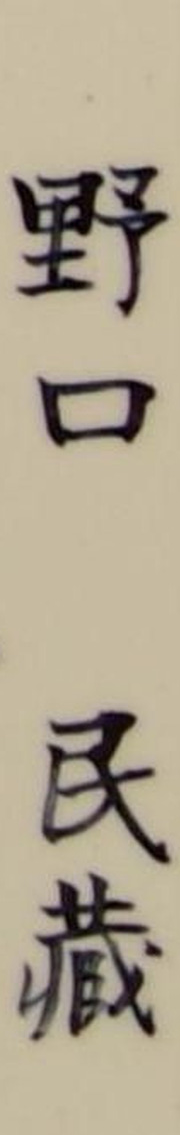野口民蔵
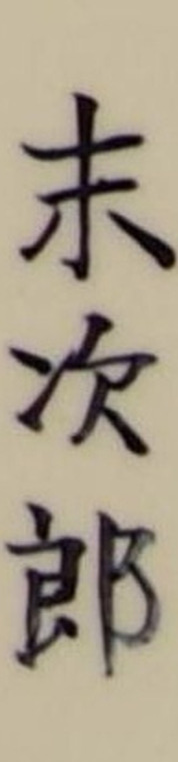末次郎
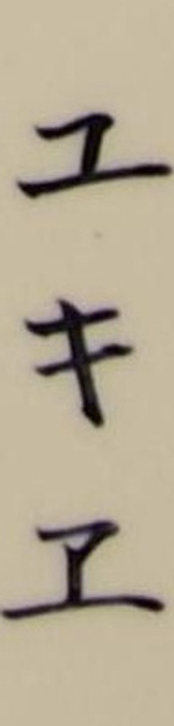ユキエ
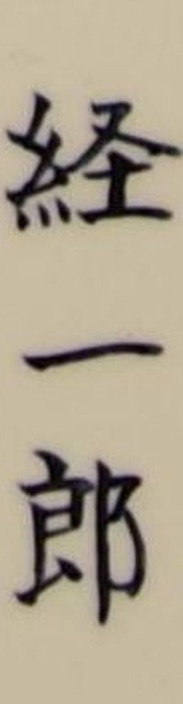経一郎
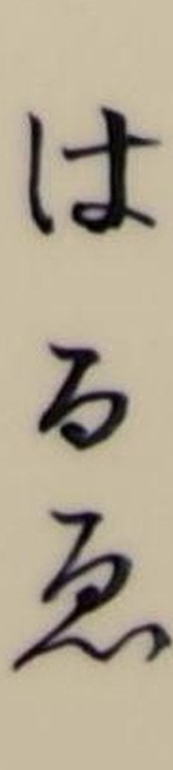はるゑ
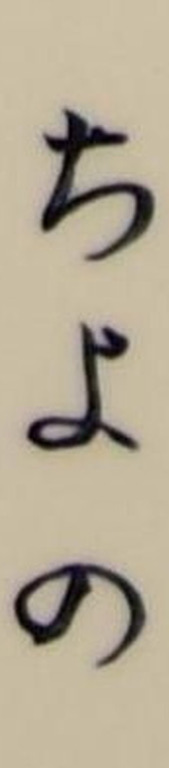ちよの
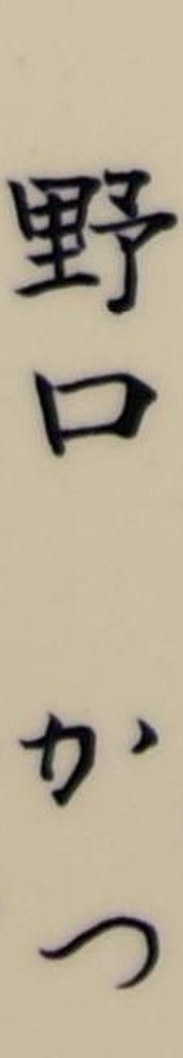野口かつ
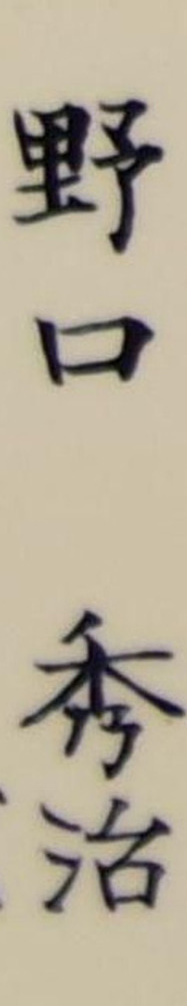野口秀治
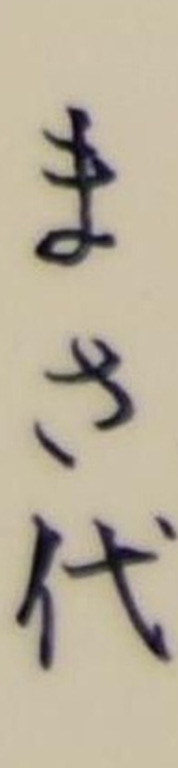まさ代
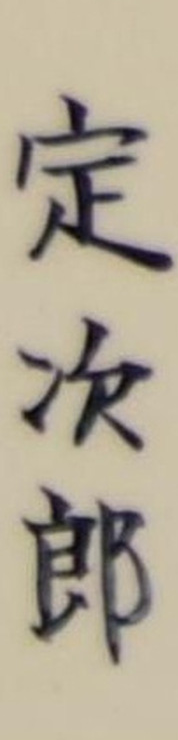定次郎
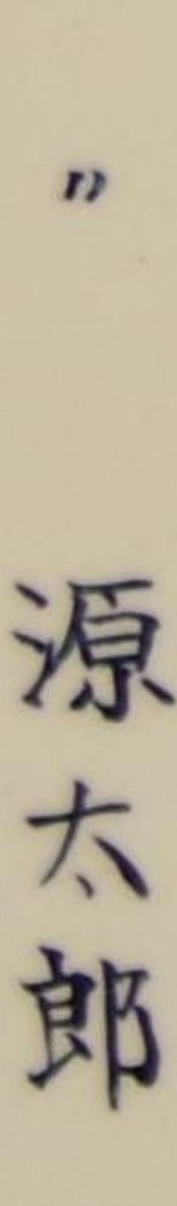源太郎
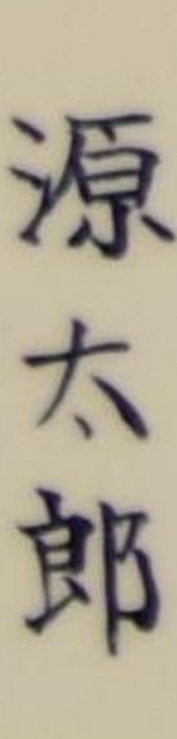源太郎

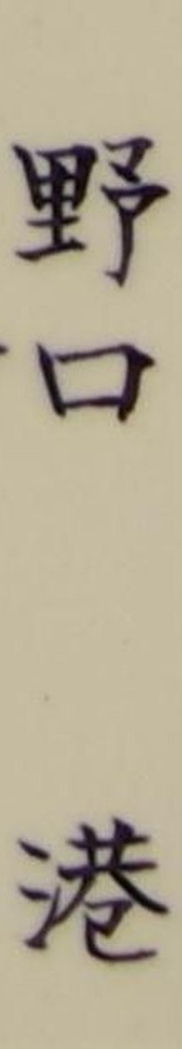野口港
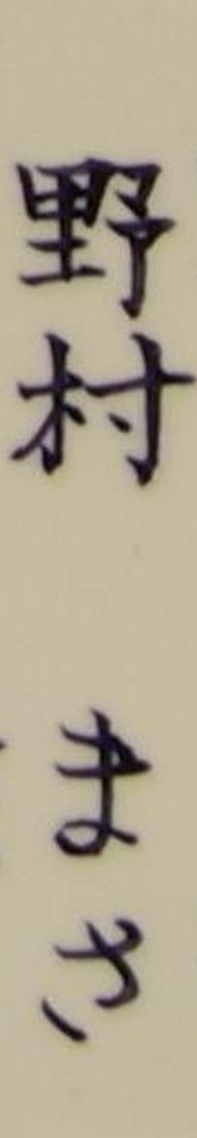野村まさ
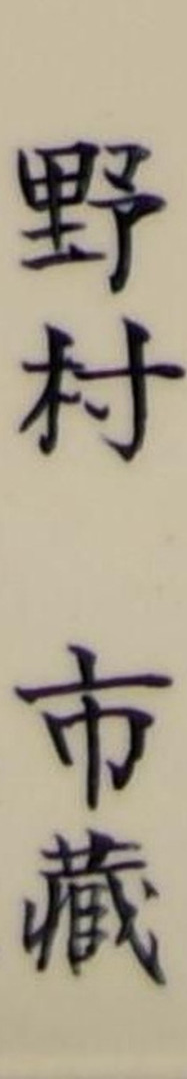野村市蔵
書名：A~D
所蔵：koyasan kongobuji
